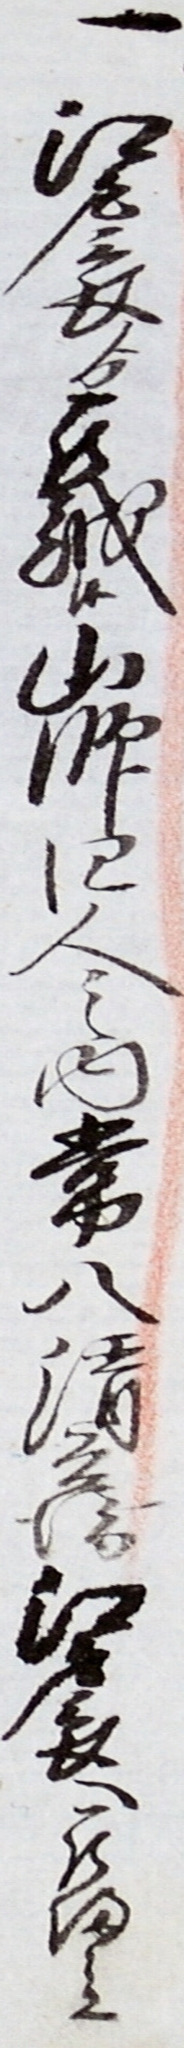一江戸表より罷越候山師四人之内常八清兵衛江戸表へ被帰立
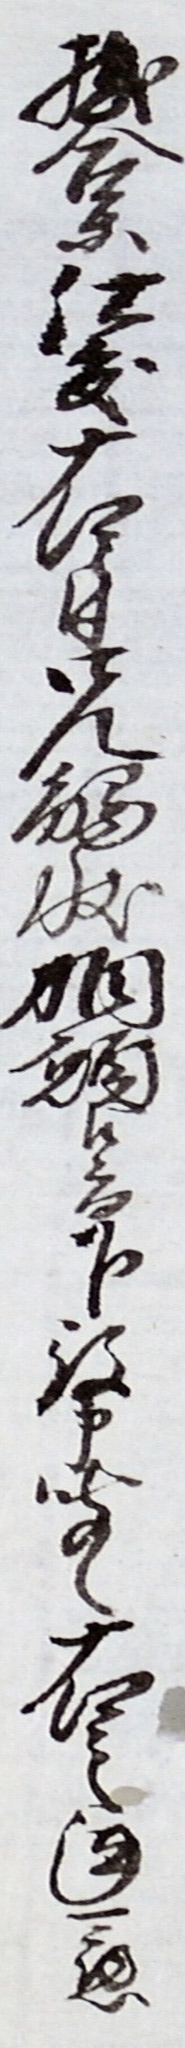掛合等仕度右ニ付先触状相願候旨下役申聞候右之趣一応
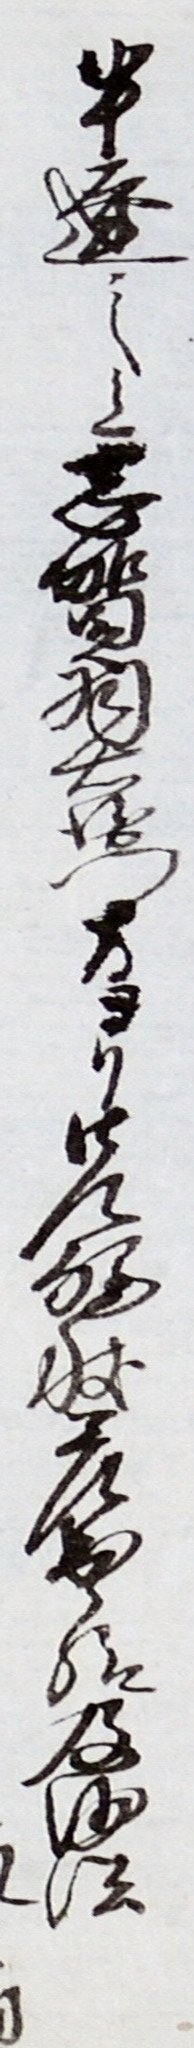申達し之上志賀羽右衛門方ヨリ先触状差出候様及沙汰
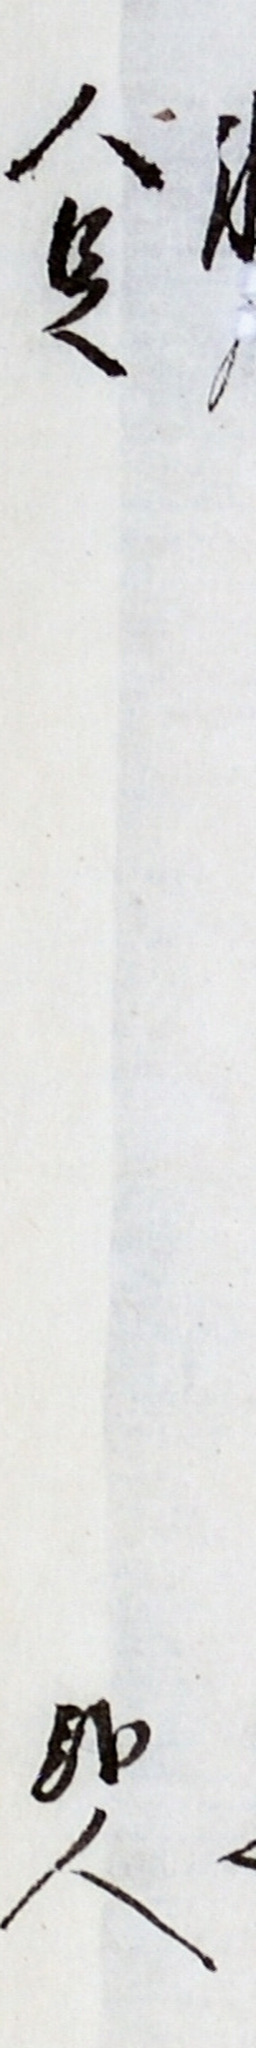人足弐人
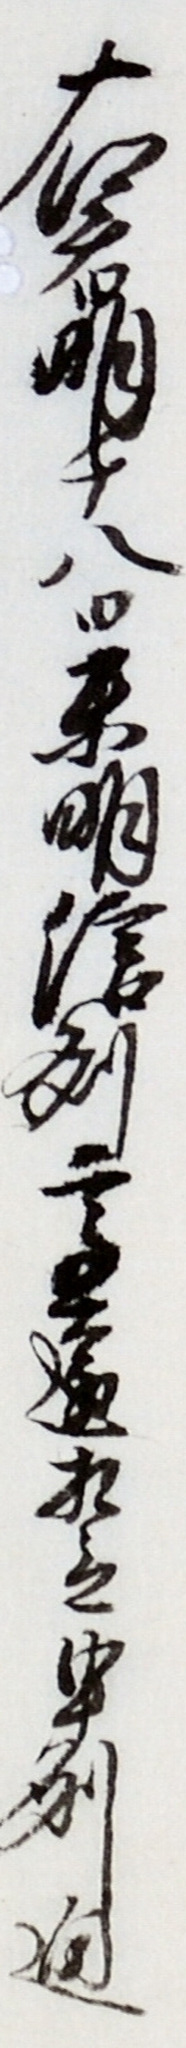右は明十八日未明信州高遠相立甲州通
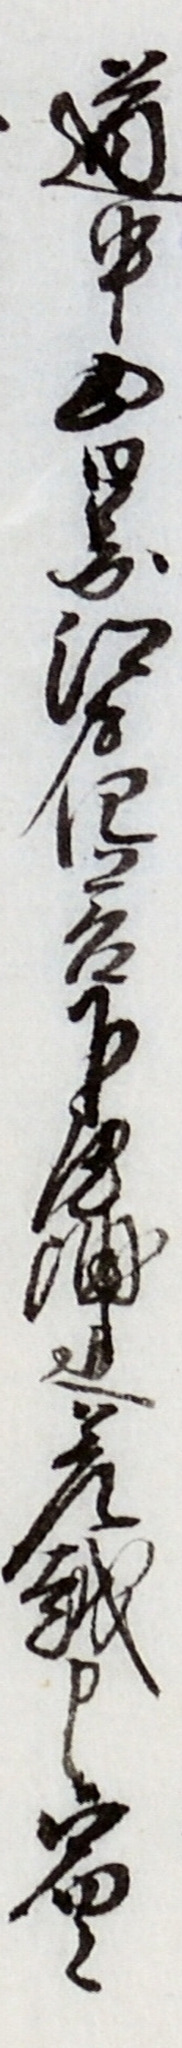道中五日図江戸四ツ谷下屋敷迄差越申候宿之
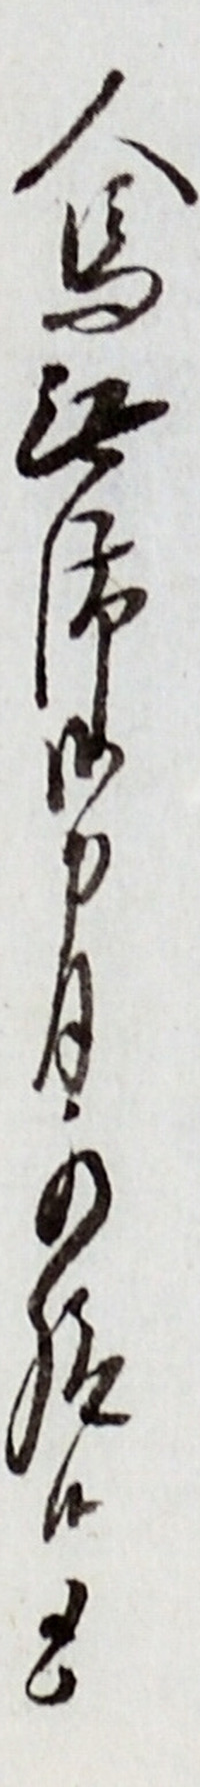人馬無滞御申月可給候以上
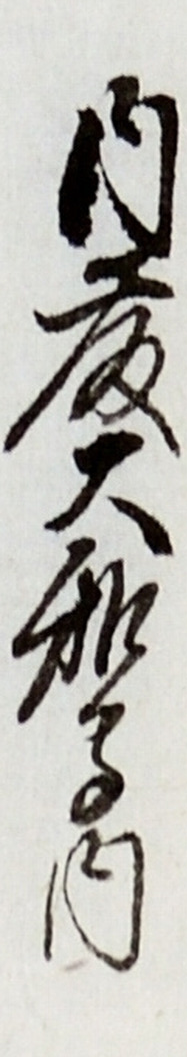内藤大和守内
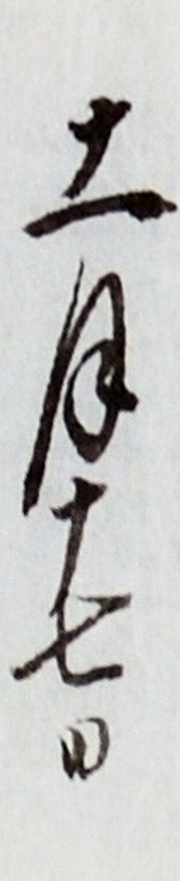十一月十七日
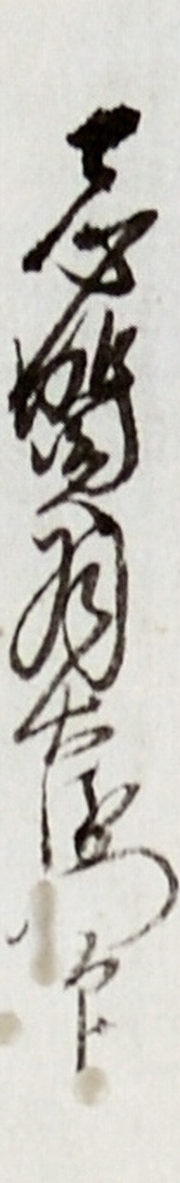志賀羽右衛門印
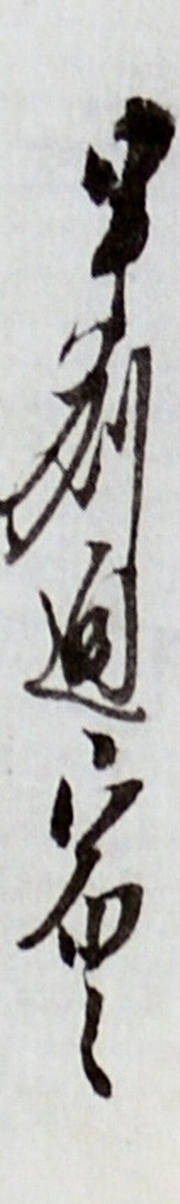甲州通宿々
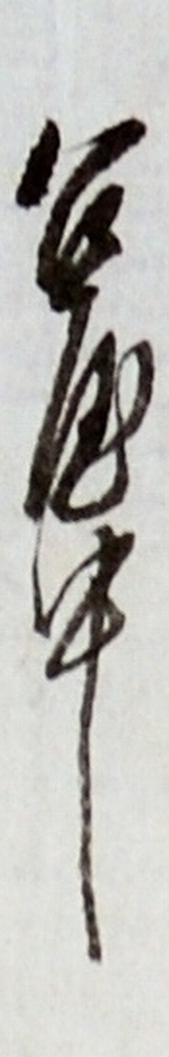問屋中
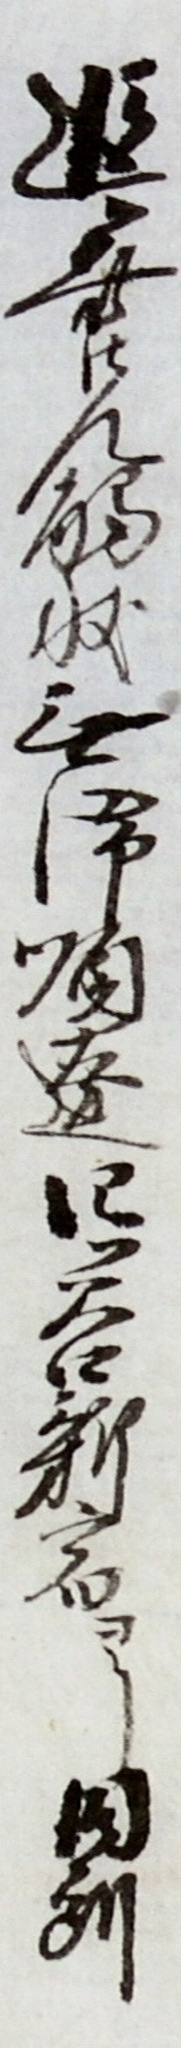追々此先触状無滞順達四ツ谷新宿ヨリ同所
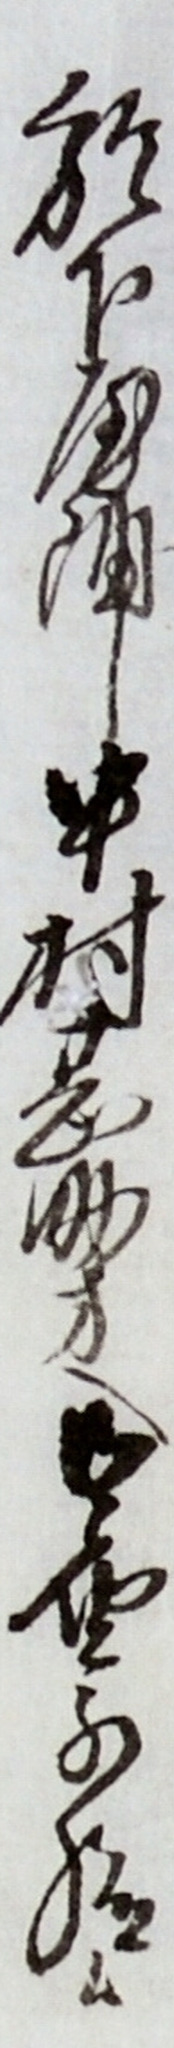於下屋敷中村甚助方へ御届候

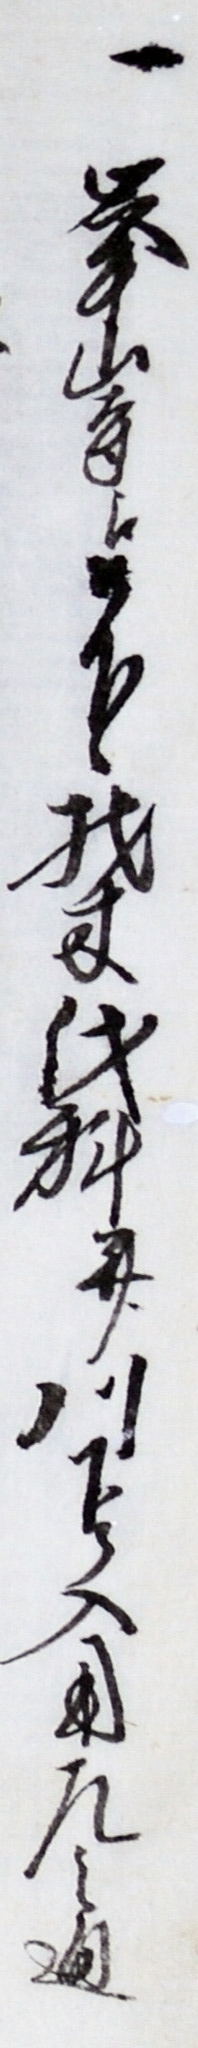一峯山寺江被下候材木代料并川下ニ入用左之通
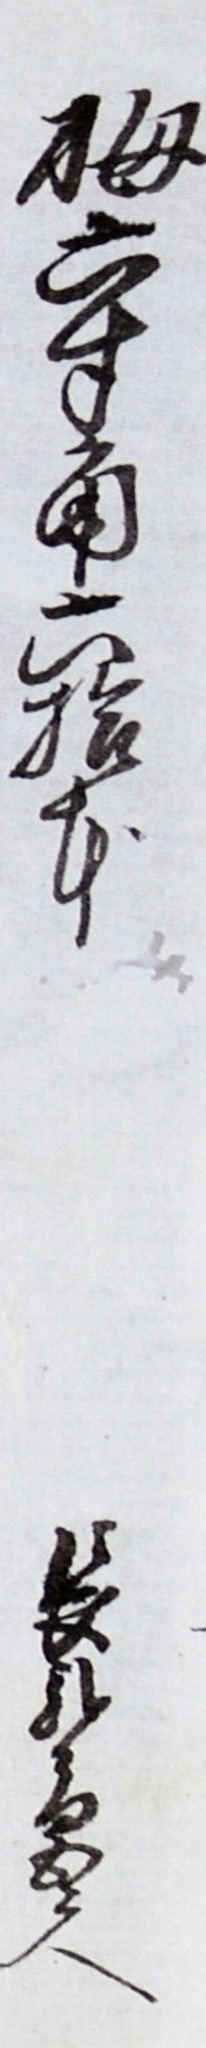梅六寸角六拾本長弐百五尺
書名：御山奉行御用控
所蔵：伊那市立高遠町図書館・合同会社AMANE
